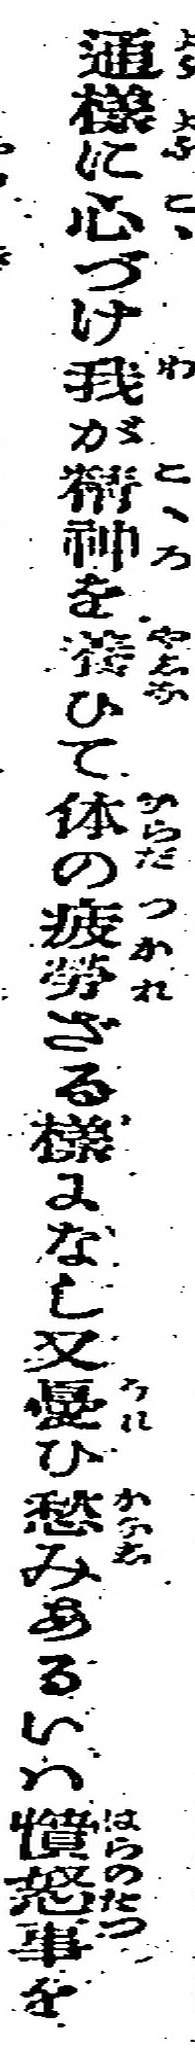通様に志づけ我が精神を養ひて体の疲労ざる様になし又憂ひ愁みあるいは憤怒事を
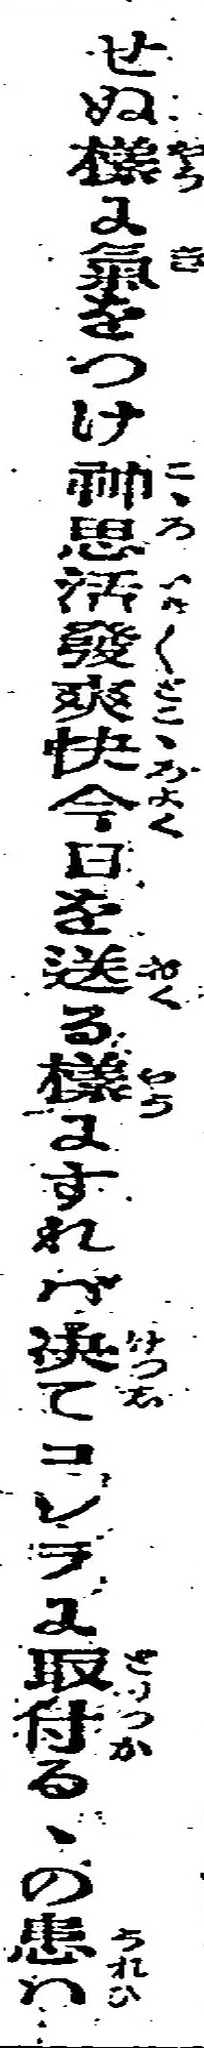せぬ様に氣をつけ神思活發爽快今日を送様にすれば決てコレラに取付るゝの患は
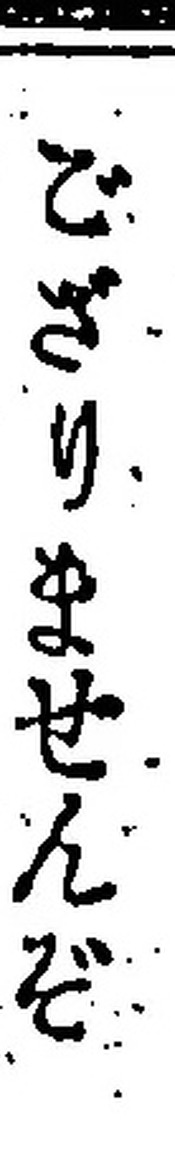ござりませんぞ
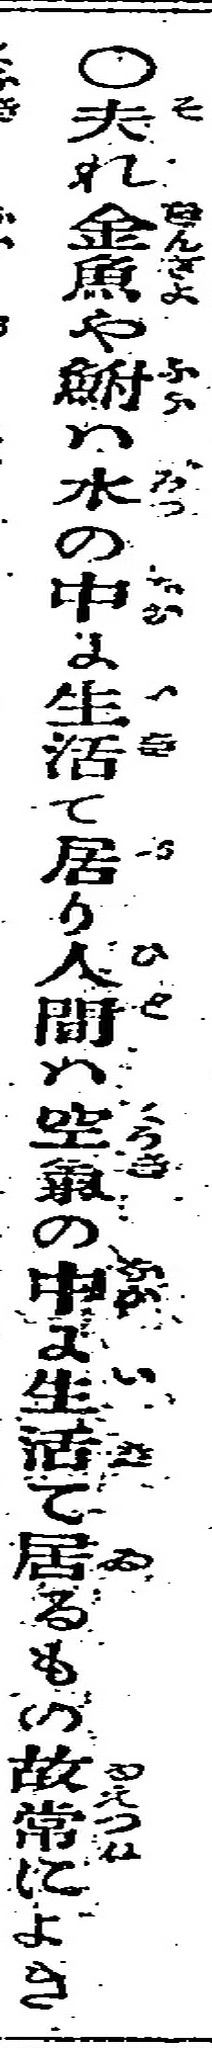〇夫れ金魚や鮒は水の中に生活て居り人間は空氣の中に生活て居もの故常によき
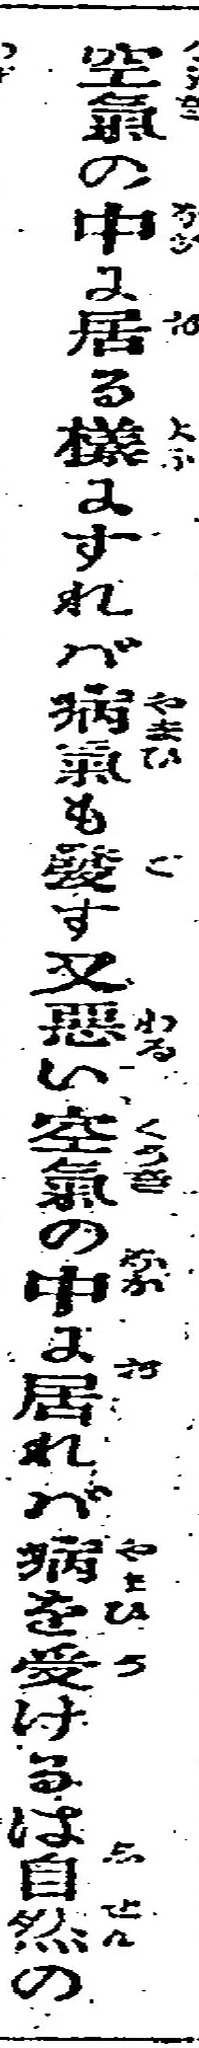空氣の中に居る様にすれば病氣も發す又惡い空氣の中に居れば病を受けるは自然の
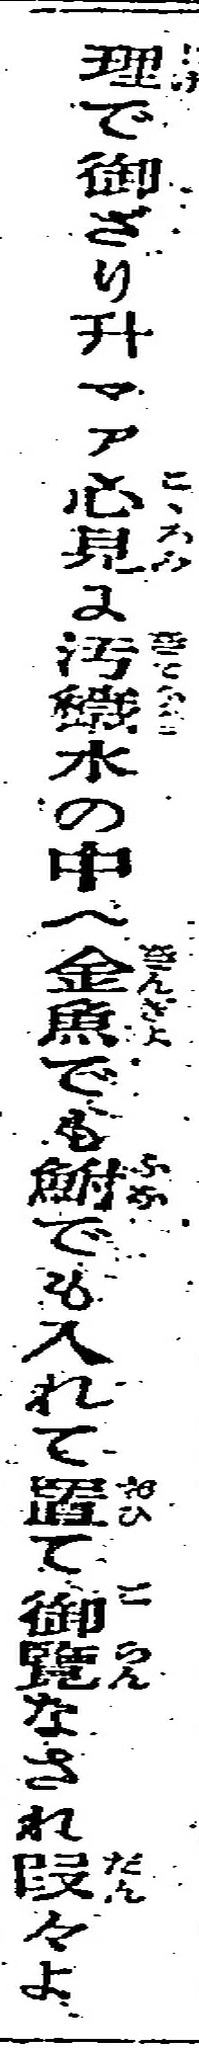理で御ざり升マア心見に汚穢水の中へ金魚でも鮒でも入れて置て御覧なされ叚々に

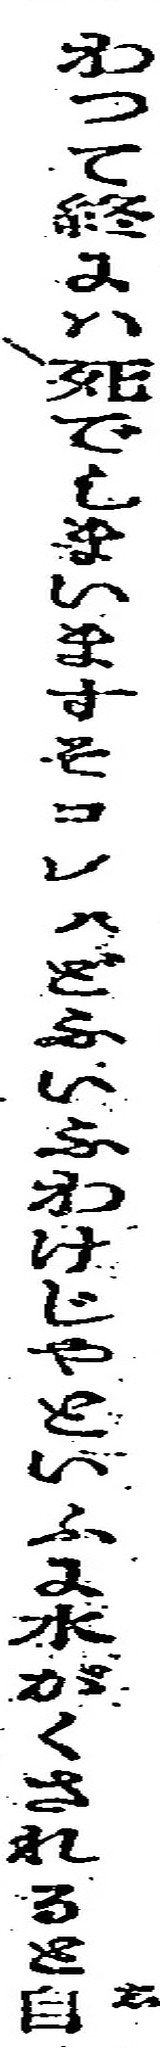かつて終には死でしまいますそコレハどふいふわけじやといふに水がくされると自
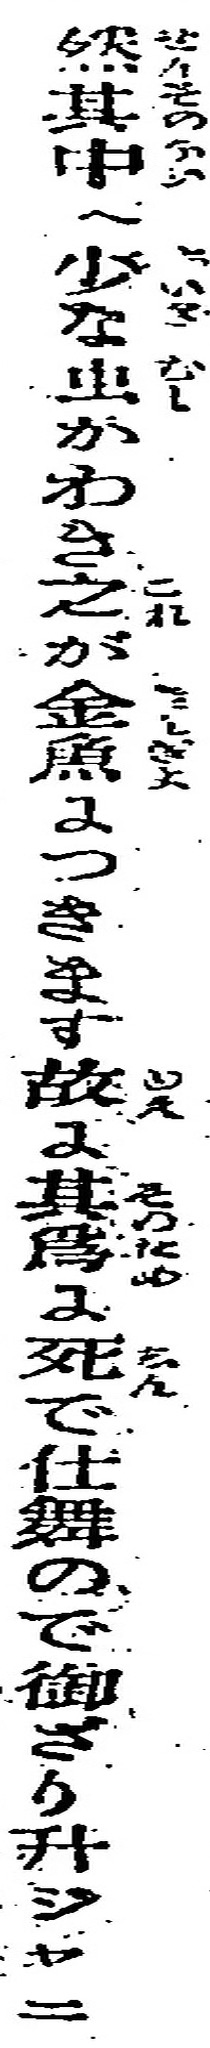然其中へ少な虫がわき之が金魚につきます故に其為に死で仕舞ので御ざり升ジヤニ
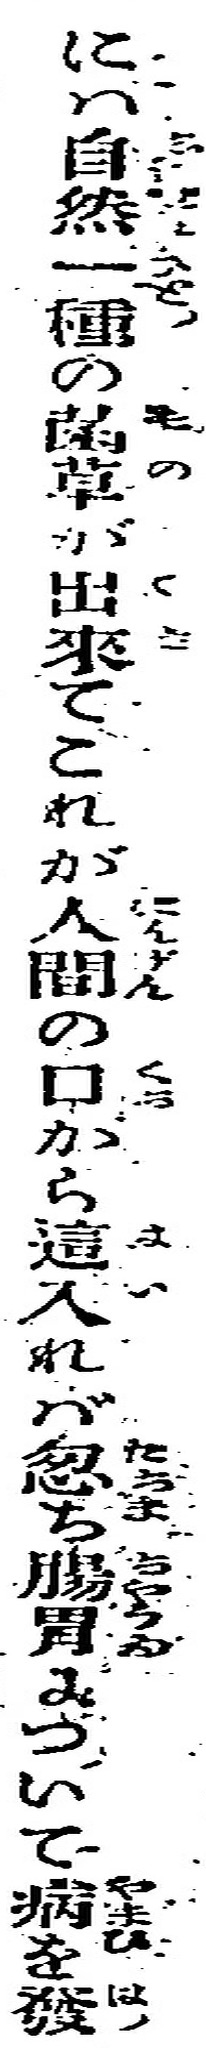には自然一種の菌草が出來てこれが人間の口から這入れば忽ち膓胃ついて病を發
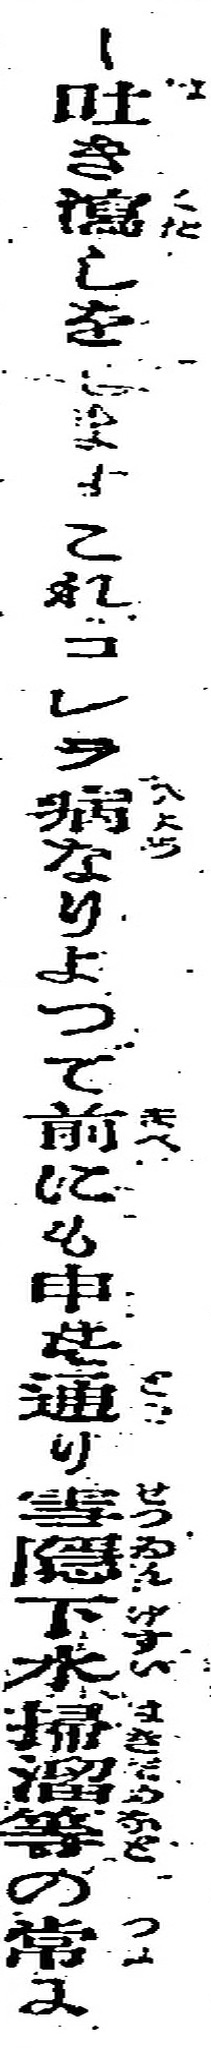し吐き瀉しをしますこれコレラ病なりよつて前にも申す通り雪隠下水掃溜等の常に
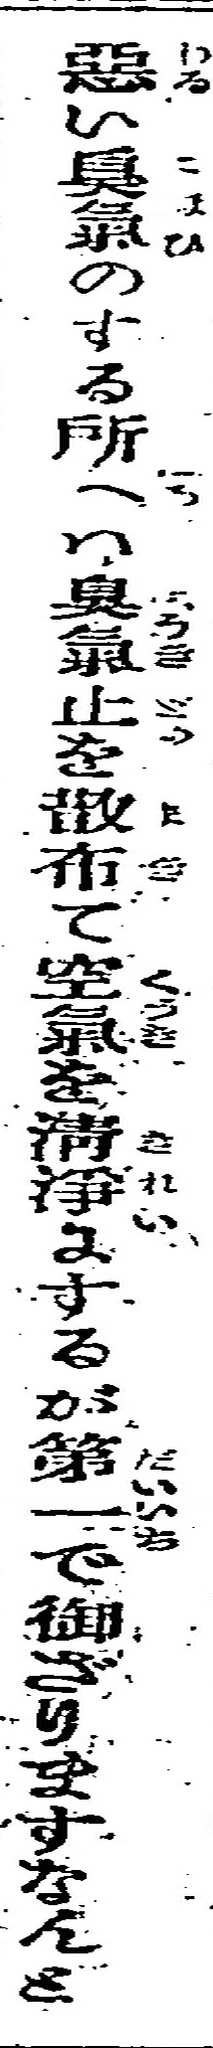惡い臭氣のする所へは臭氣止を散布て空氣を清浄にするが第一で御ざりますなんと
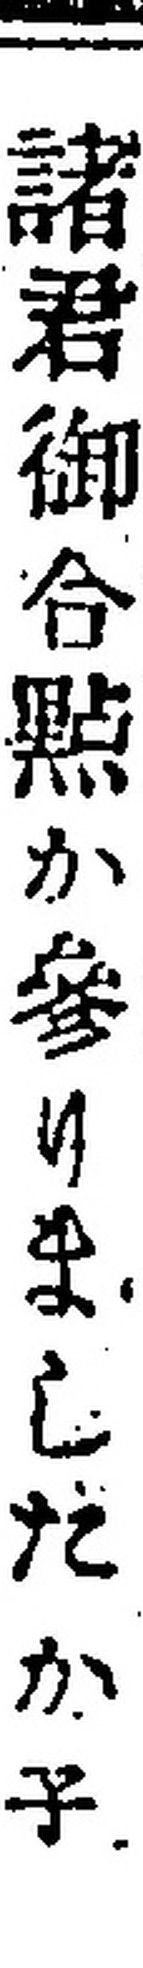諸君御合點か参りましたかね
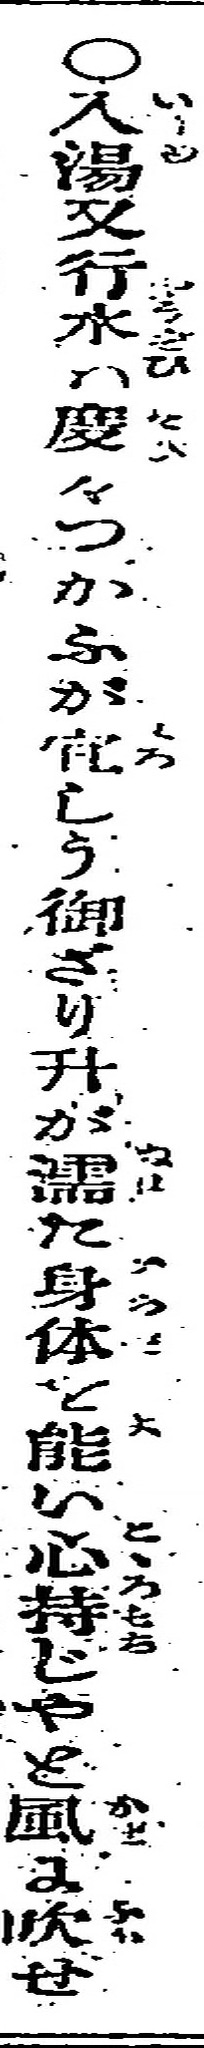〇入湯又行水は度々つかふが宜しう御ざり升が濡た身体を能い心待じやと風に吹せ
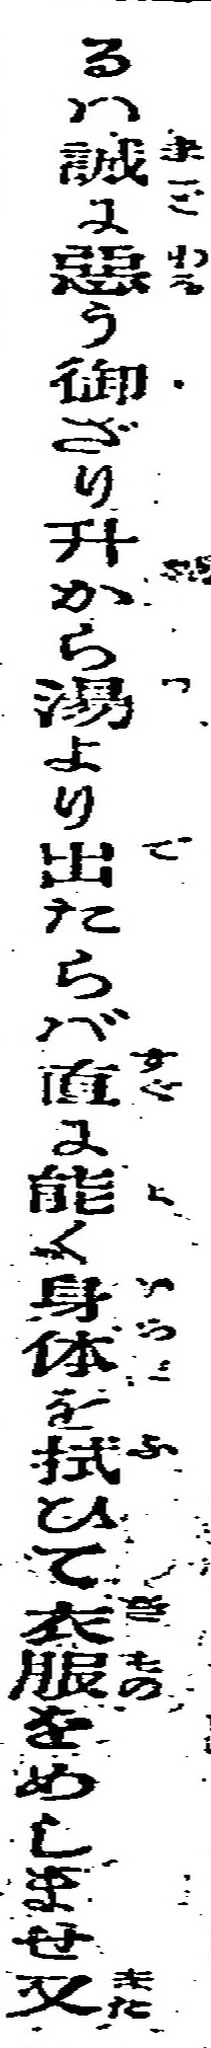るは誠に惡う御ざり升から湯より出たらば直に能く身体を拭ひて衣服をめしませ又
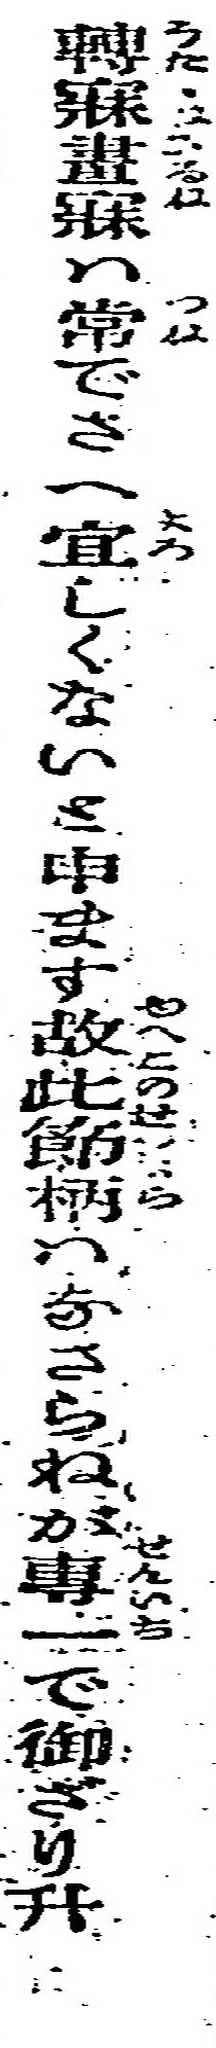轉寝晝寝は常でさへ宜しくないと申ます故此節柄はなさらねが専一で御ざり升
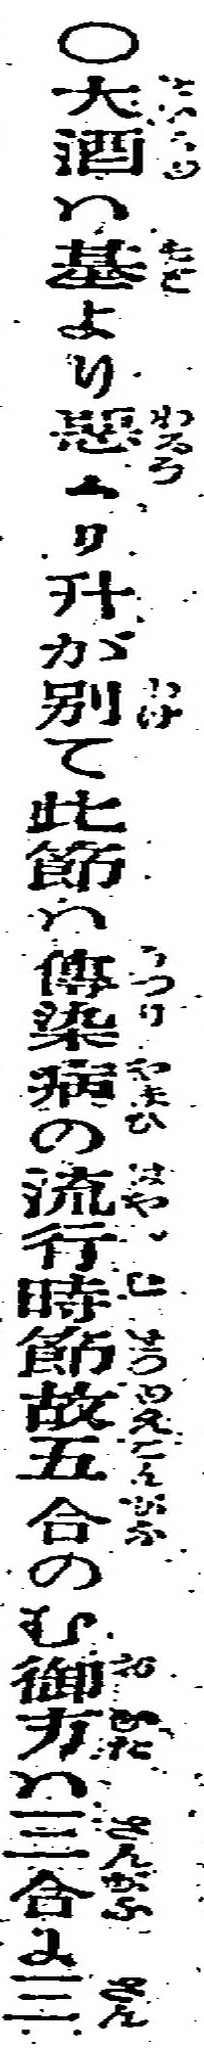〇大酒は基より惡ふり升が別て此節は傅染病の流行時節故五合のむ御方は三合に三
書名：虎列剌病予防の心得
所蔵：国立国会図書館 National Diet Library, JAPAN
